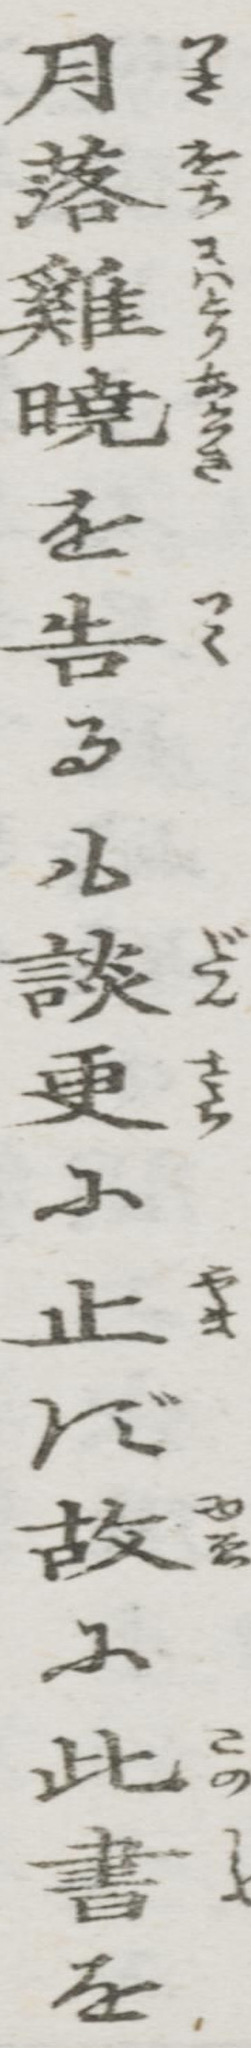月落鷄暁を告るも談更に止ず故に此書を
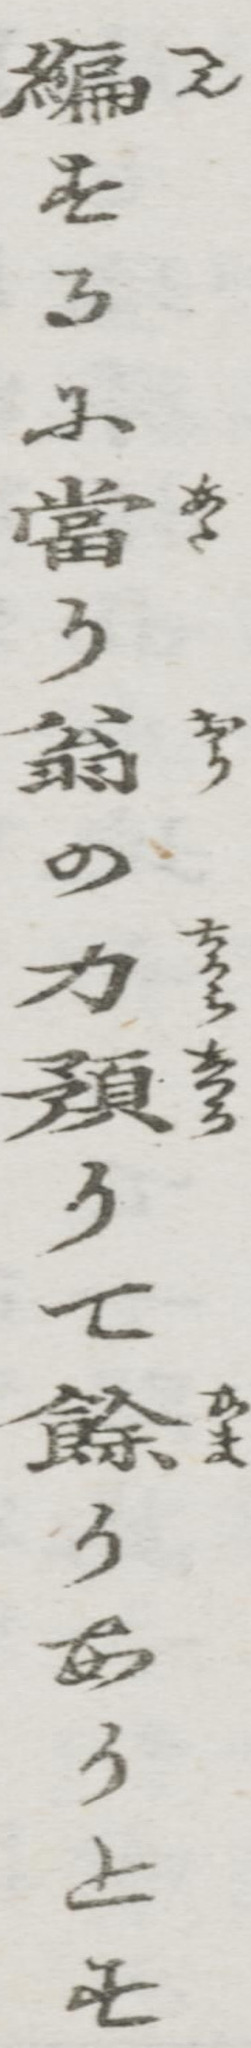編するに当り翁の力預りて余りありとす
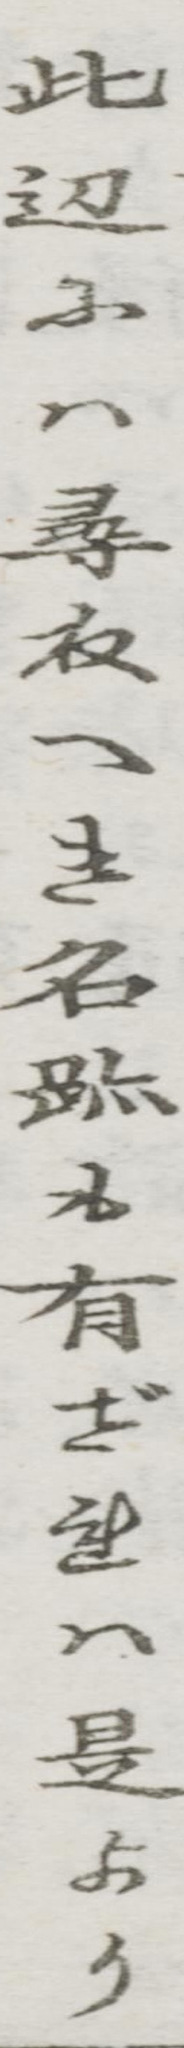此辺には尋ぬへき名跡も有ざれは是より
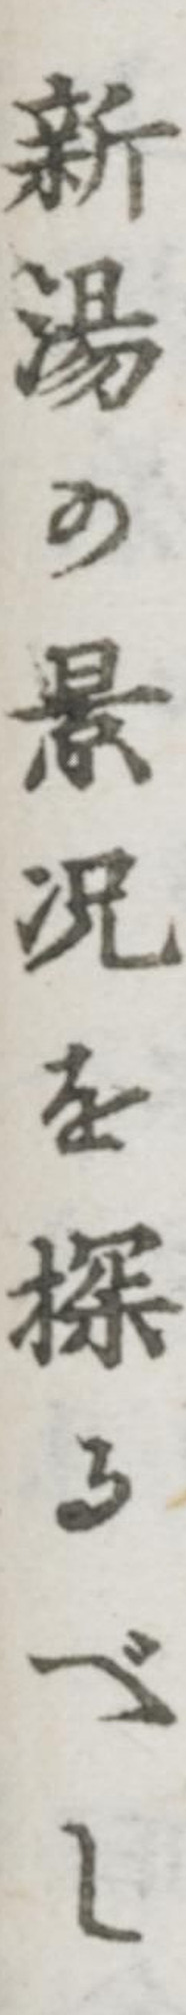新湯の景況を探るべし
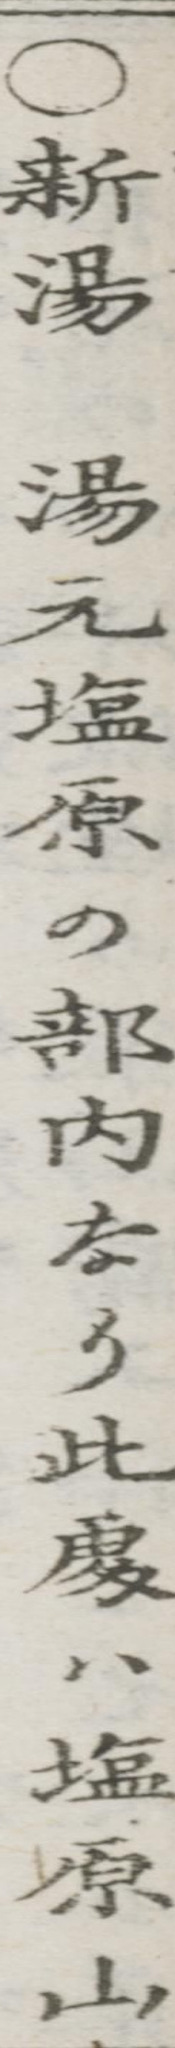○新湯湯元塩原の部内なり此処は塩原山
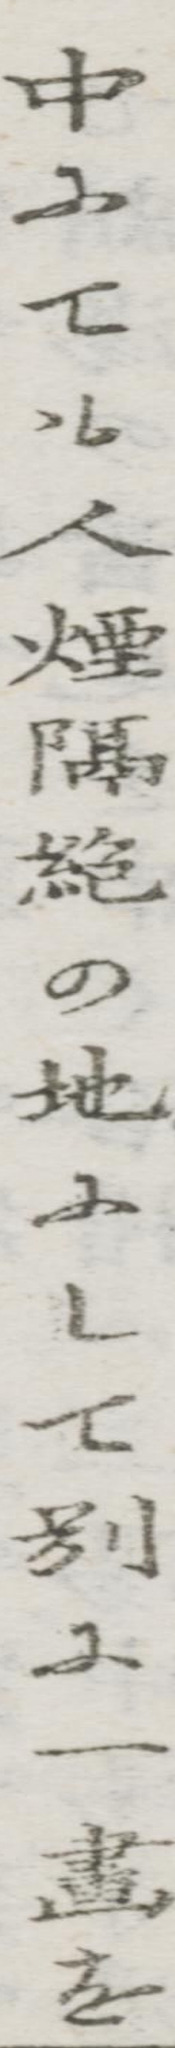中にても人煙隔絶の地にして別に一画を
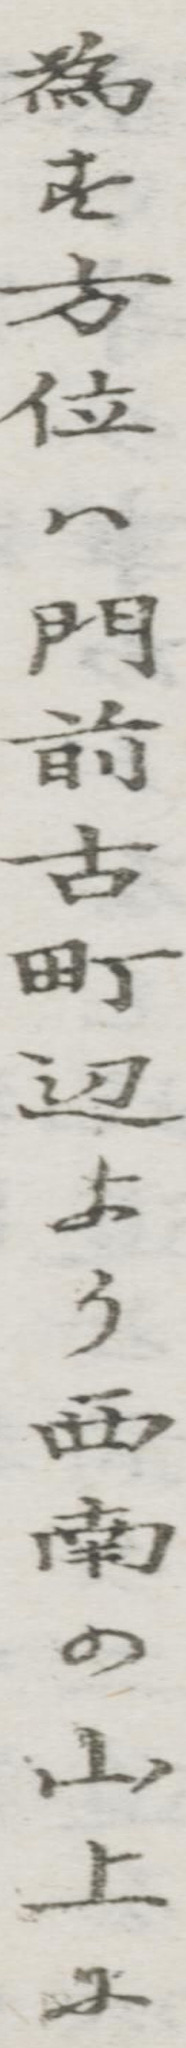為す方位は門前古町辺より西南の山上に
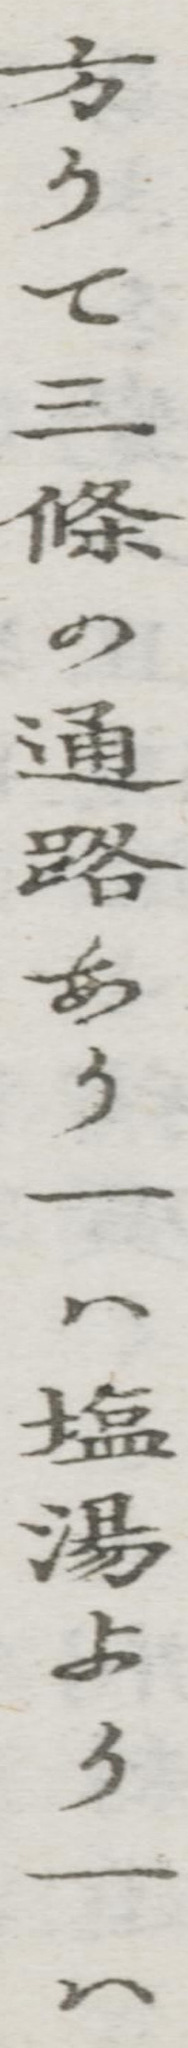方りて三條の通路あり一は塩湯より一は
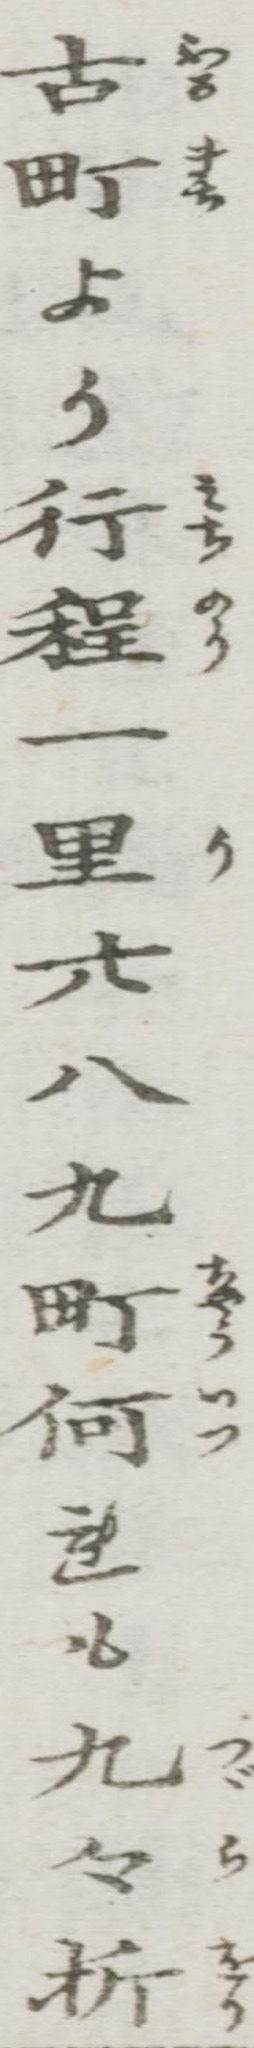古町より行程一里廿八九町何れも九々折
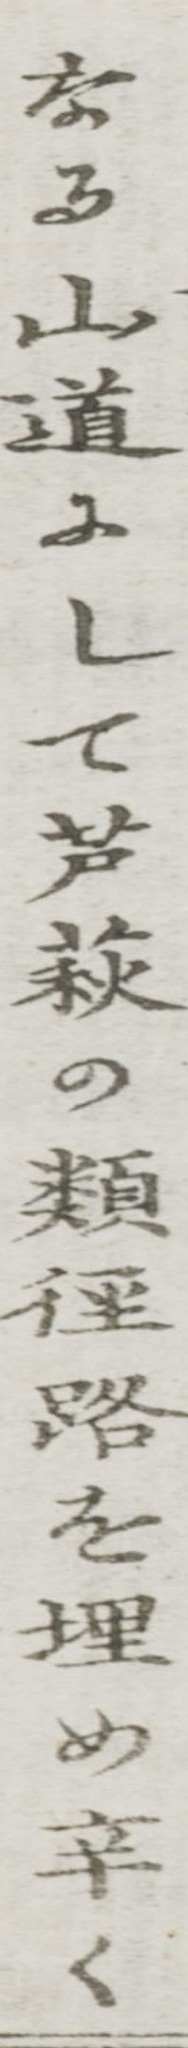なる山道にして芦萩の類径路を埋め辛く
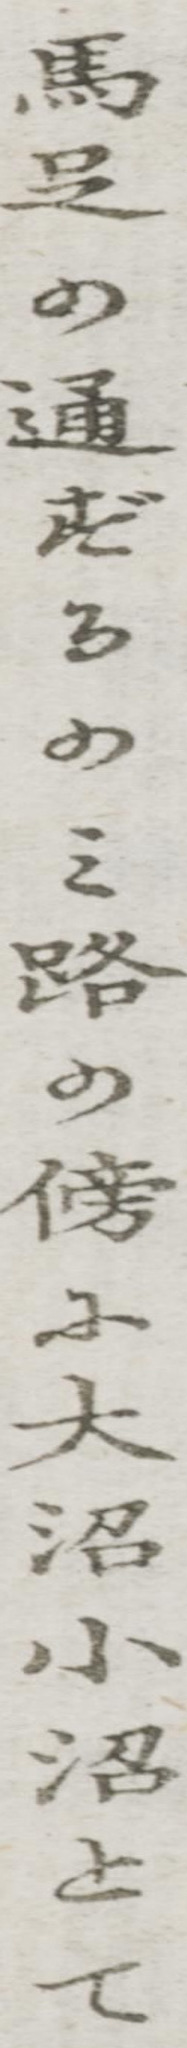馬足の通ずるのみ路の傍に大沼小沼とて
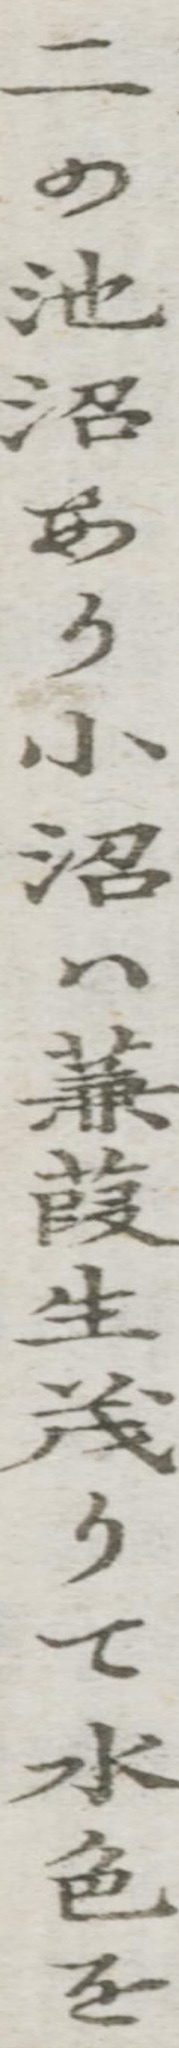二の池沼あり小沼は兼葭生茂りて水色を

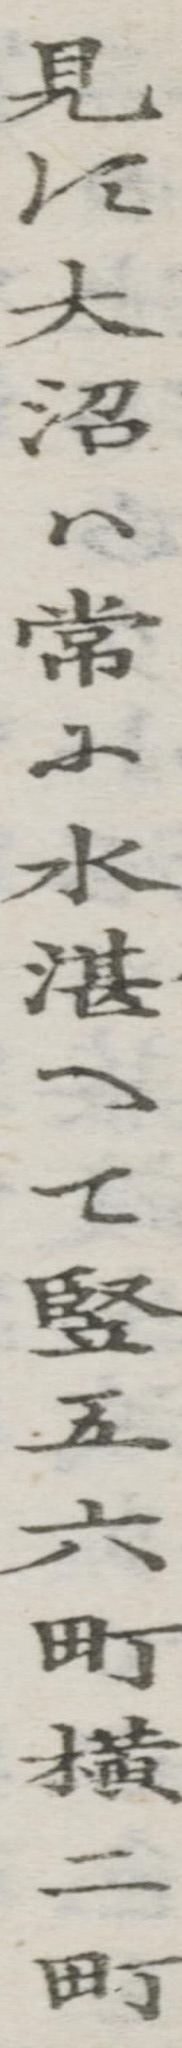見す大沼は常に水湛へて竪五六町横二町
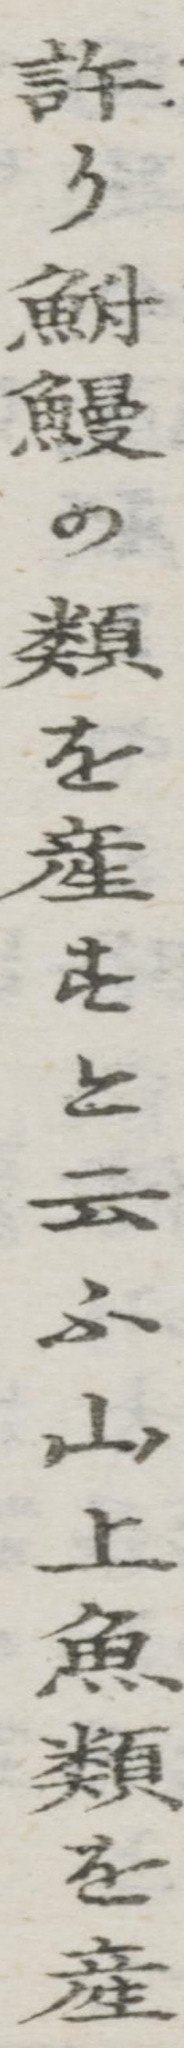許り鮒鰻の類を産すと云ふ山上魚類を産
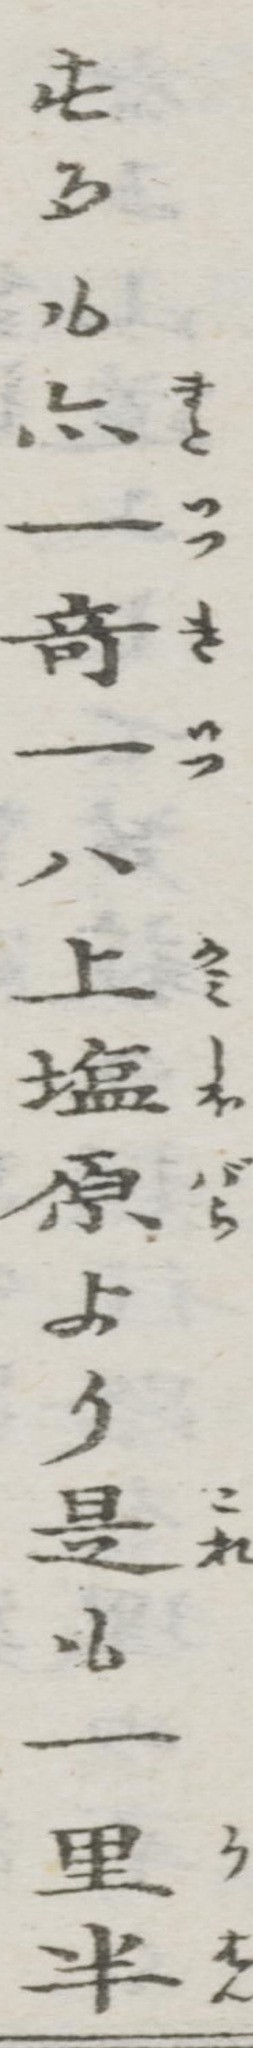するも亦一奇一は上塩原より是も一里半
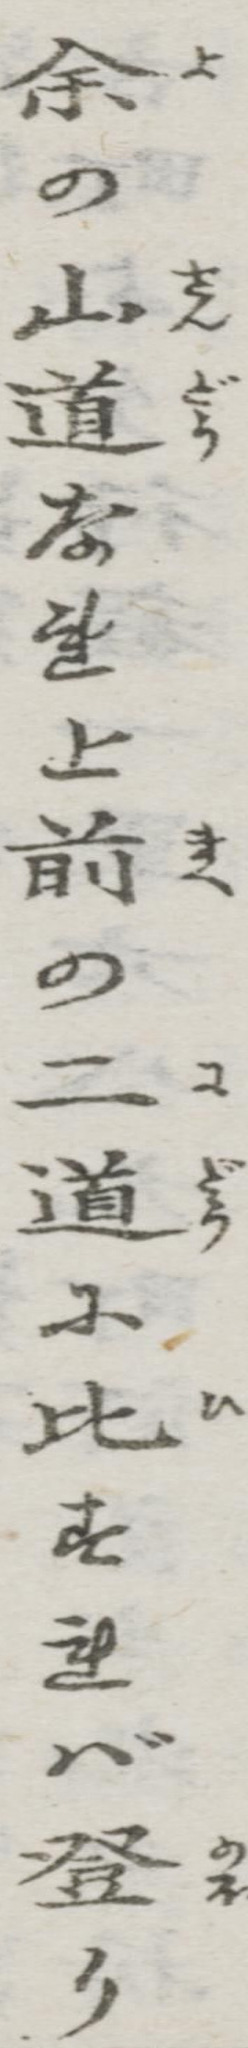余の山道なれと前の二道に比すれば登り
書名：塩原繁昌記　全
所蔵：東京大学地震研究所図書室 Earthquake Research Institute Library, The University of Tokyo, JAPAN
